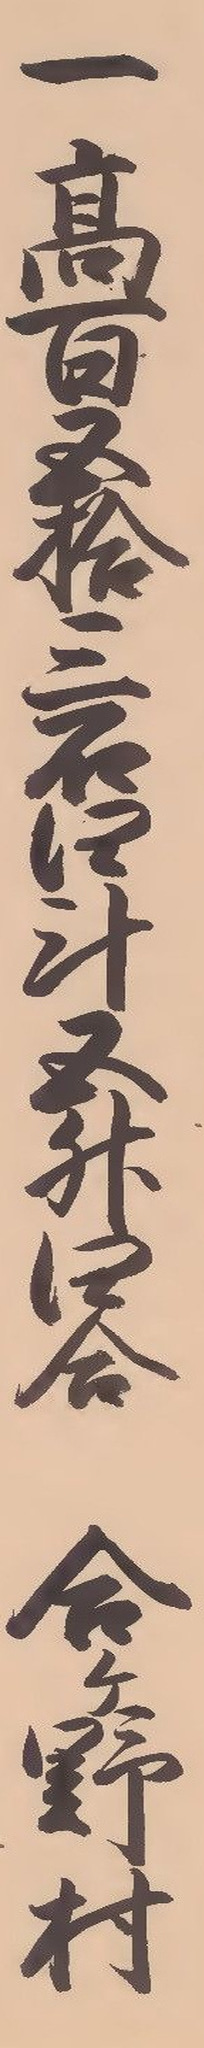一高百五拾三石四斗五升四合合ヶ野村
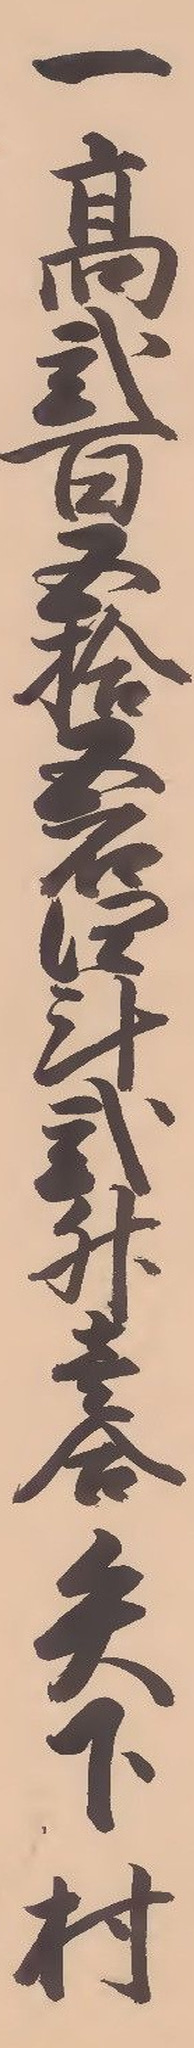一高弐百五拾五石四斗弐升壱合矢下村
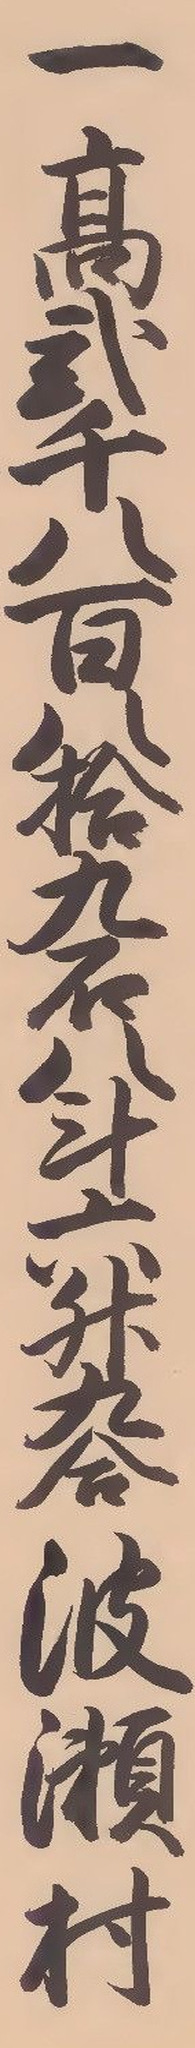一高弐千八百八拾九石八斗六升九合波瀬村

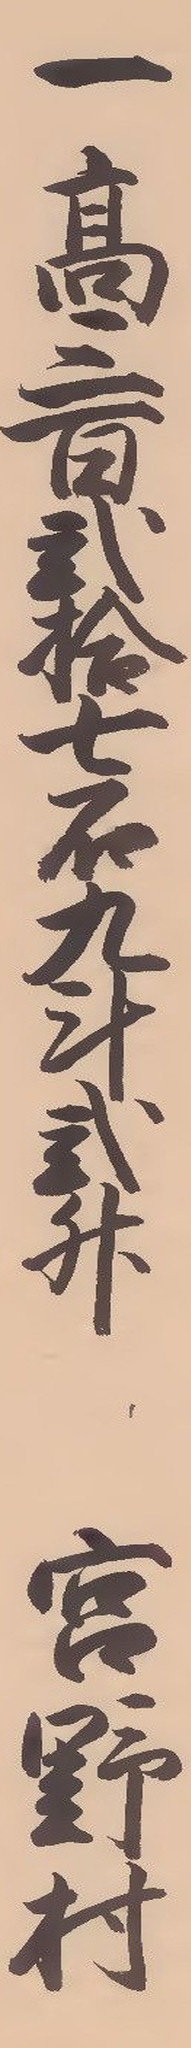一高三百弐拾七石九斗弐升宮野村
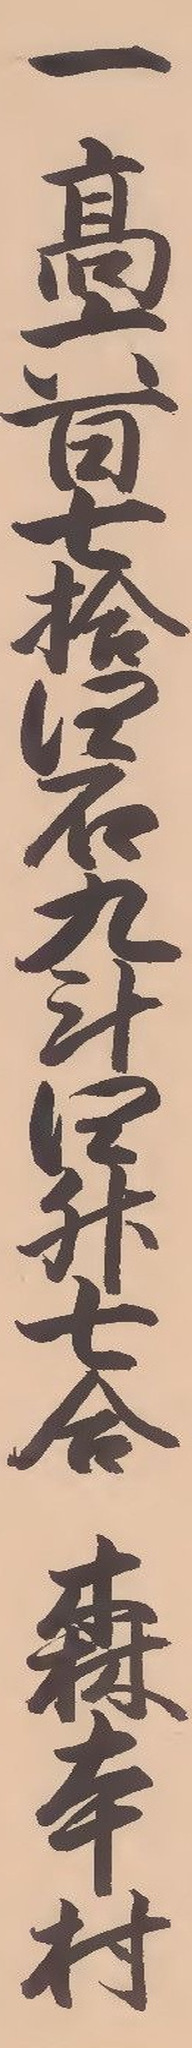一高六百七拾四石九斗四升七合森本村
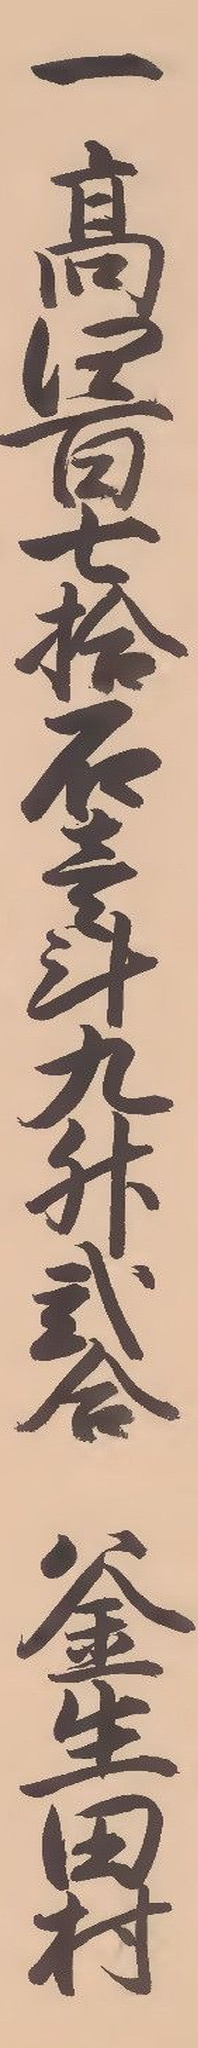一高四百七拾石壱斗九升弐合釜生田村
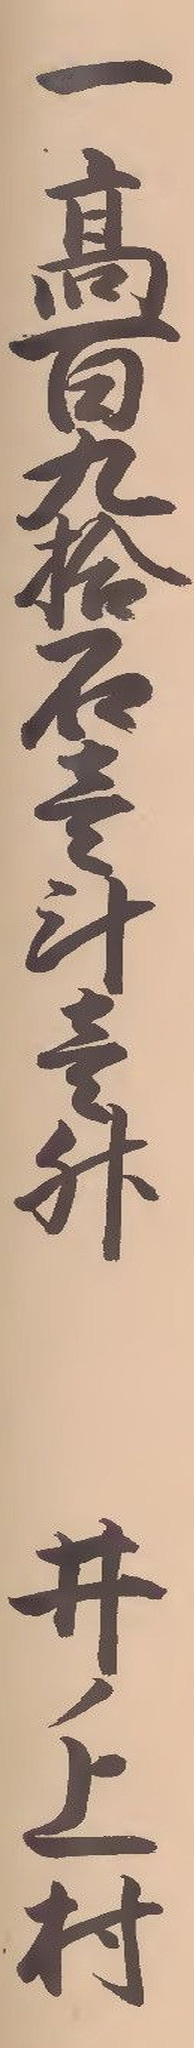一高百九拾石壱斗壱升井ノ上村
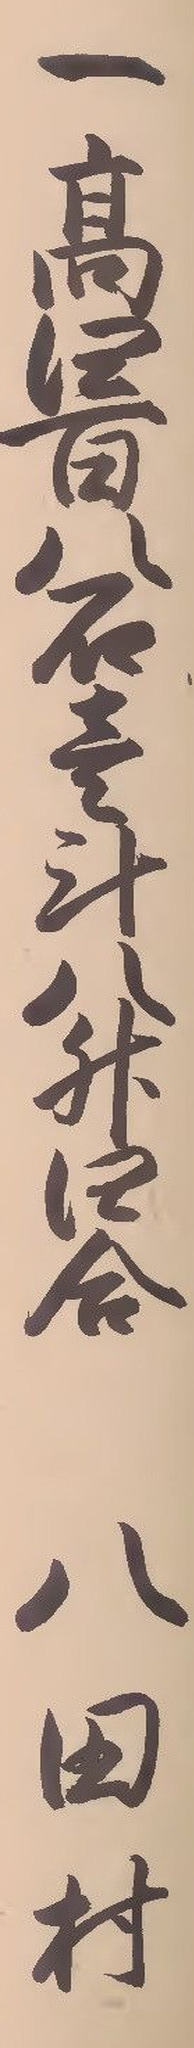一高四百八石壱斗八升四合八田村
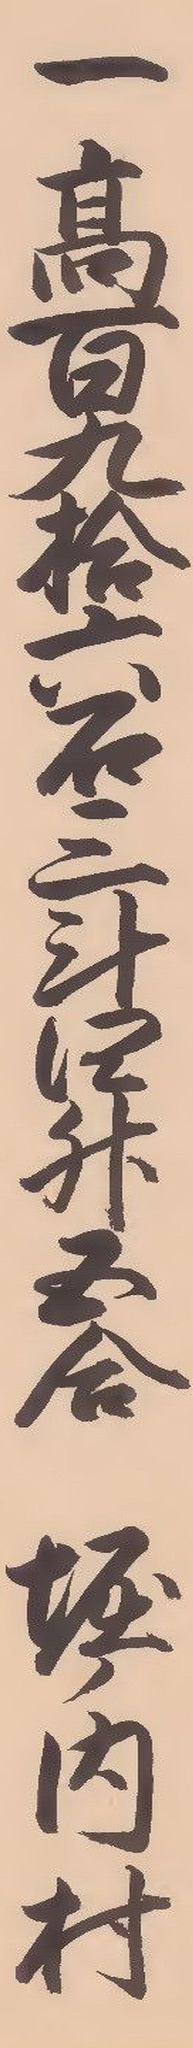一高百九拾六石三斗四升五合堀ノ内村
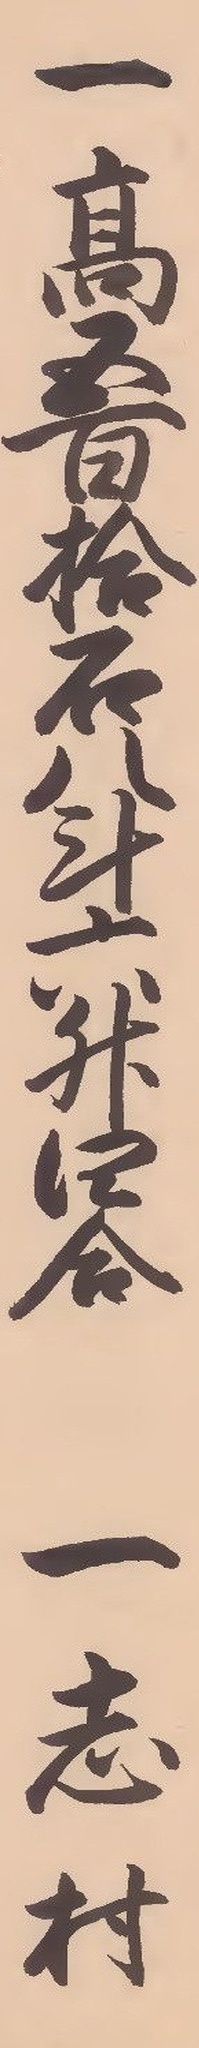一高五百拾石八斗六升四合一志村
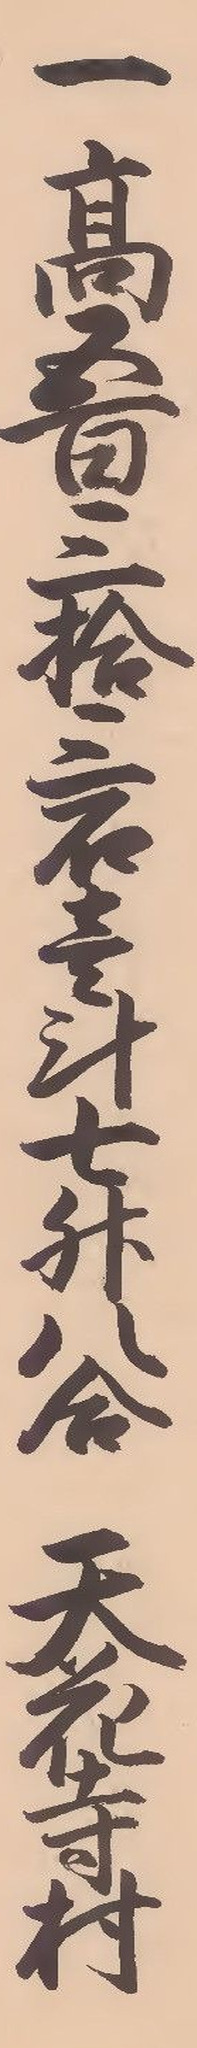一高五百三拾三石壱斗七升八合天花寺村

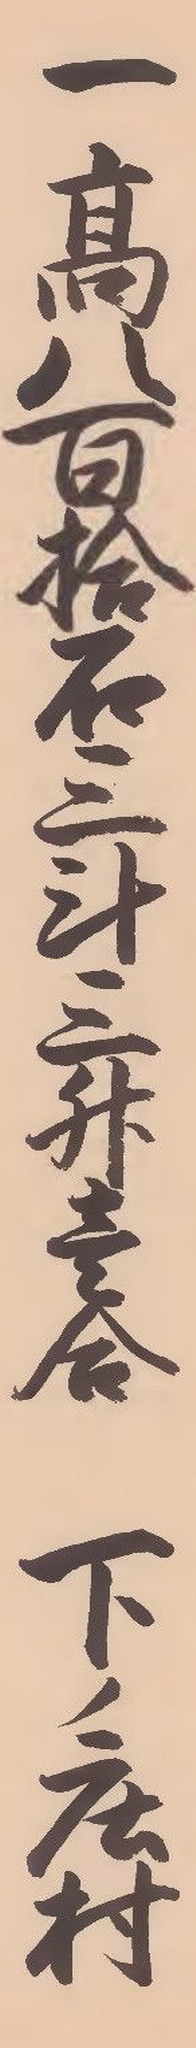一高八百拾石三斗三升壱合下ノ庄村
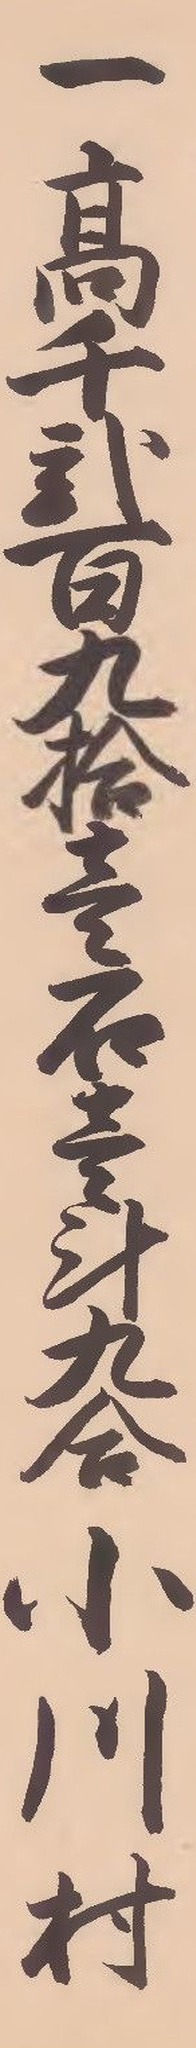一高千弐百九拾壱石壱斗九合小川村
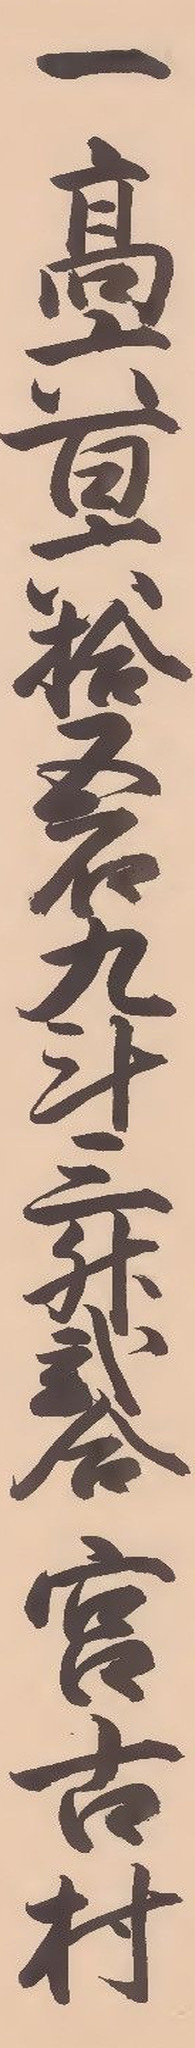一高六百六拾五石九斗三升弐合宮古村
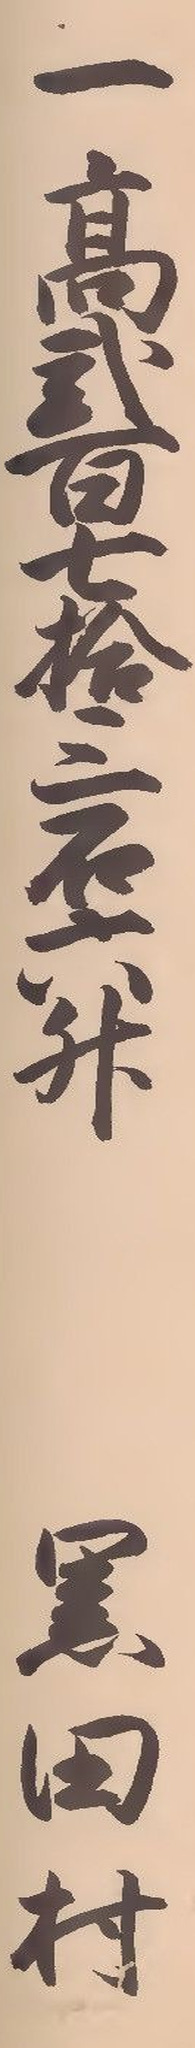一高弐百七拾三石六升黒田村
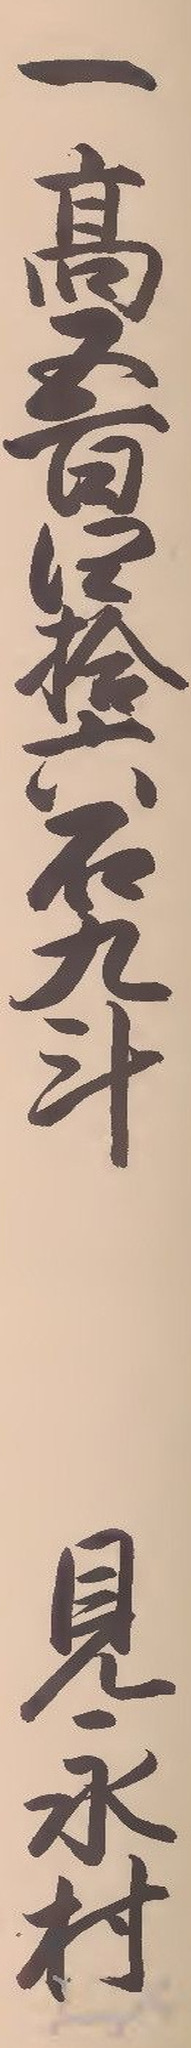一高五百四拾六石九斗見永村
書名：伊勢国郷帳
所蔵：国立公文書館 National Archives of Japan
